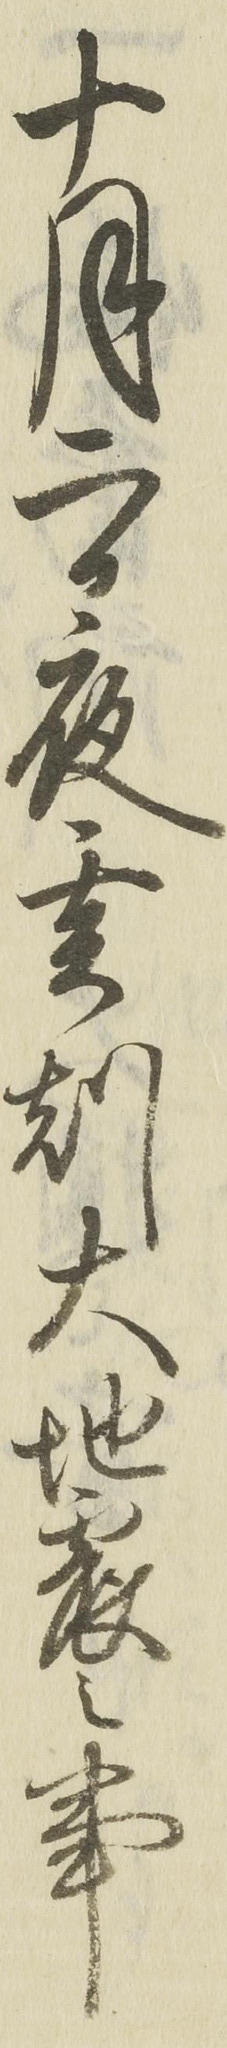十月二日夜亥刻大地震之事
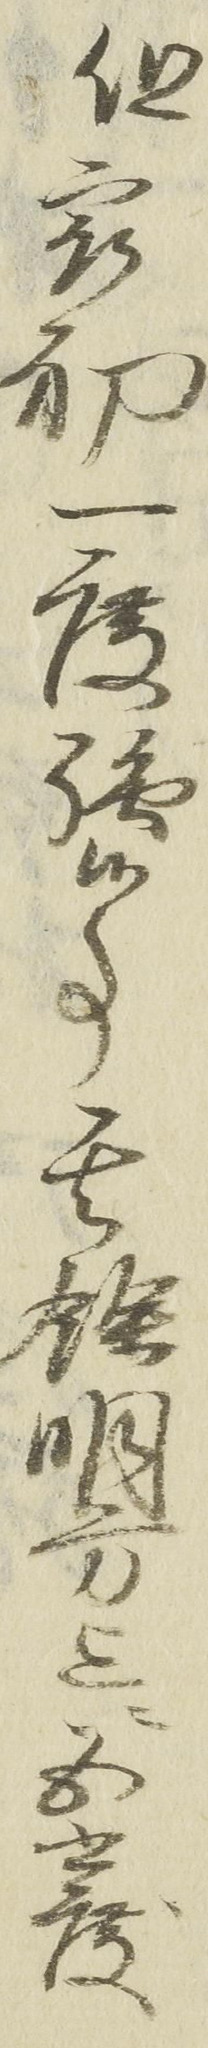但最初一度強候事其余明方迄ニ五六度
